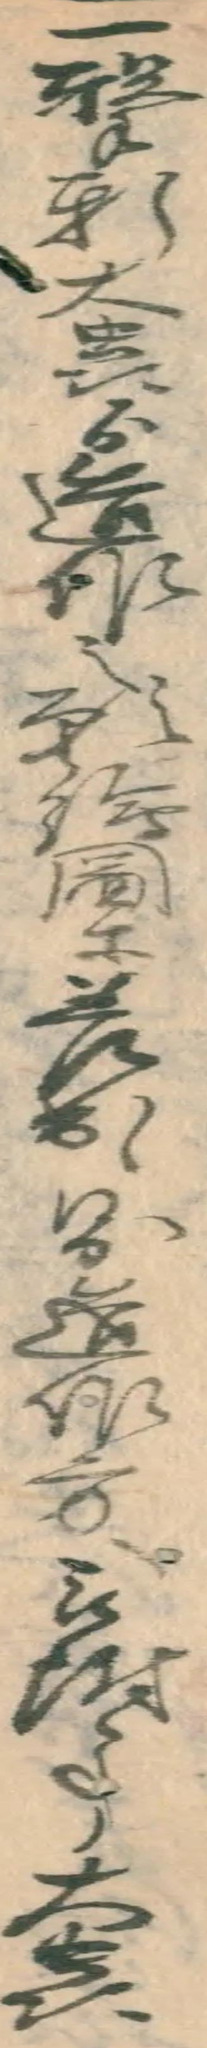一一撃軒大蟲ゟ造作之願絵図等差出候則造作方へ被付候事大蟲
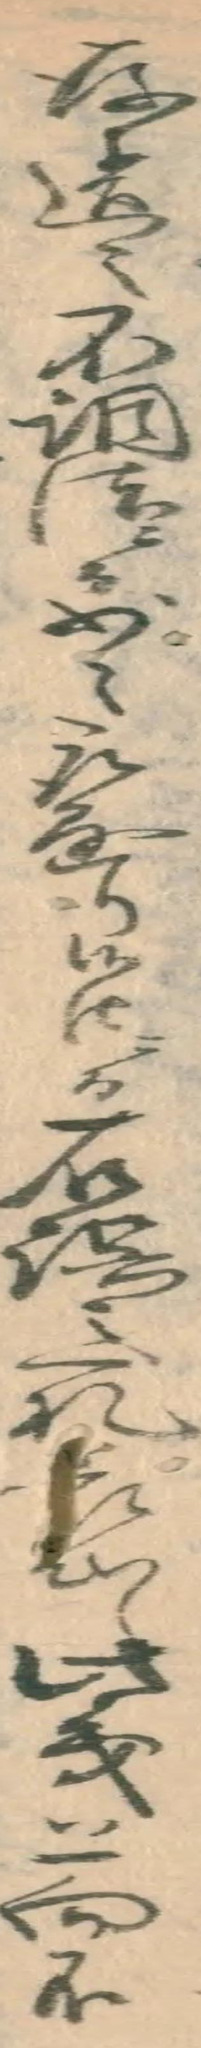存違之不調法ニ而少々取懸り候由ニ而右誤之一札差出候此義ハ一向不
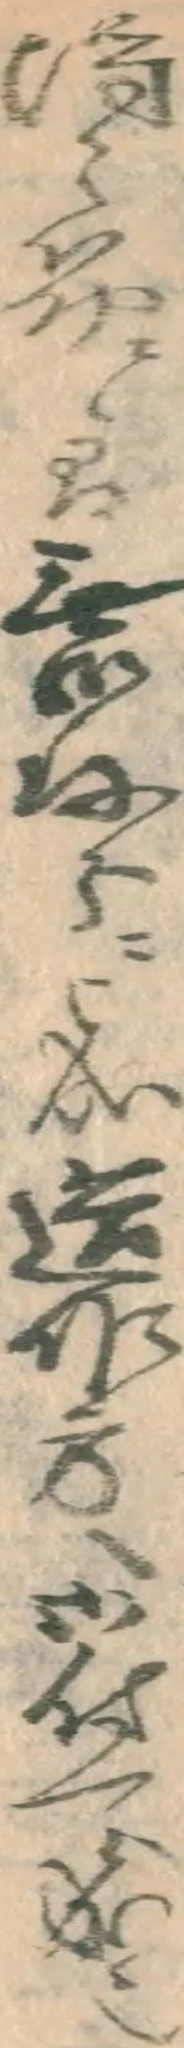埒之筋ニ候間無御存分ニ被成造作方へ御付可被成也
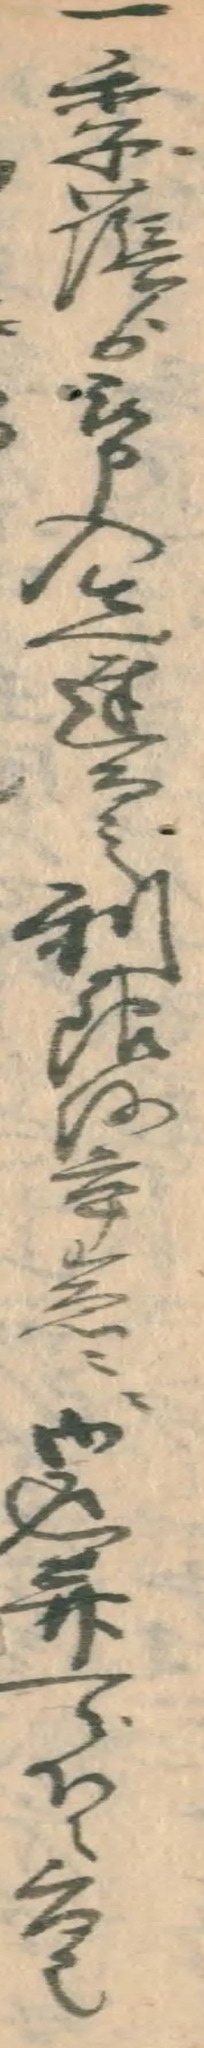一季蔭ゟ被申入先達而之利銀何卒急々ニ御返弁可被下候旨也
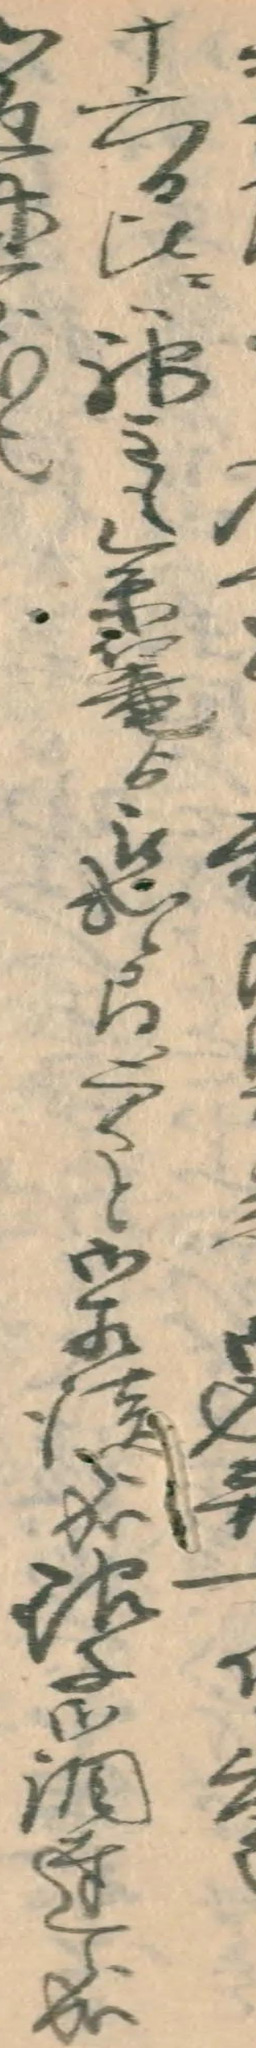十六日比ニハ神主も参篭ゟ被出候間とくと御相談被成銀子御調達被成
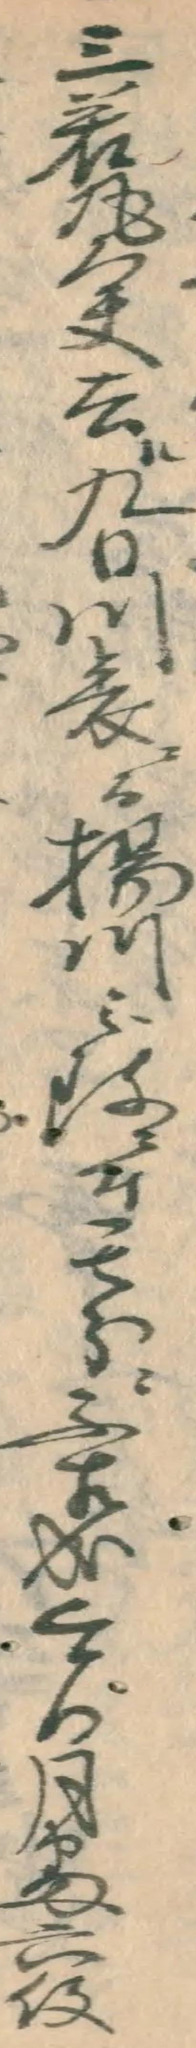一三若丸太夫去ル九日川表ニ而揚川被致ニ付其分ニ不相成今日月番六役
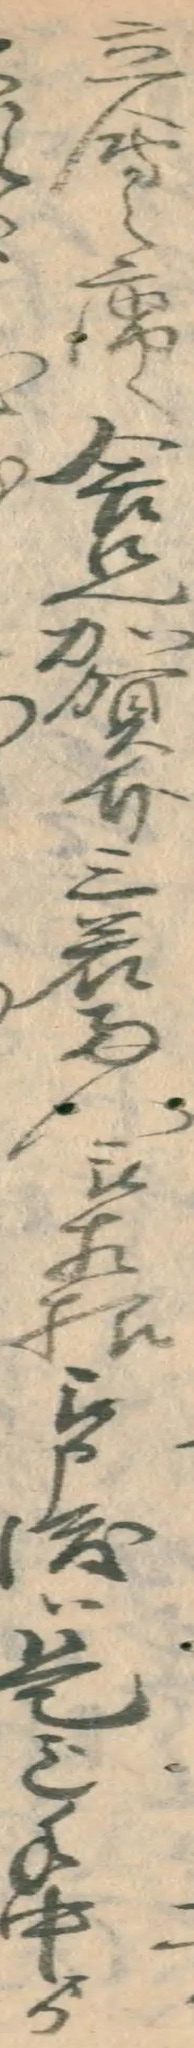立会之席へ舎兄加賀介三若両人被相招被申渡ハ是迄手中ゟ
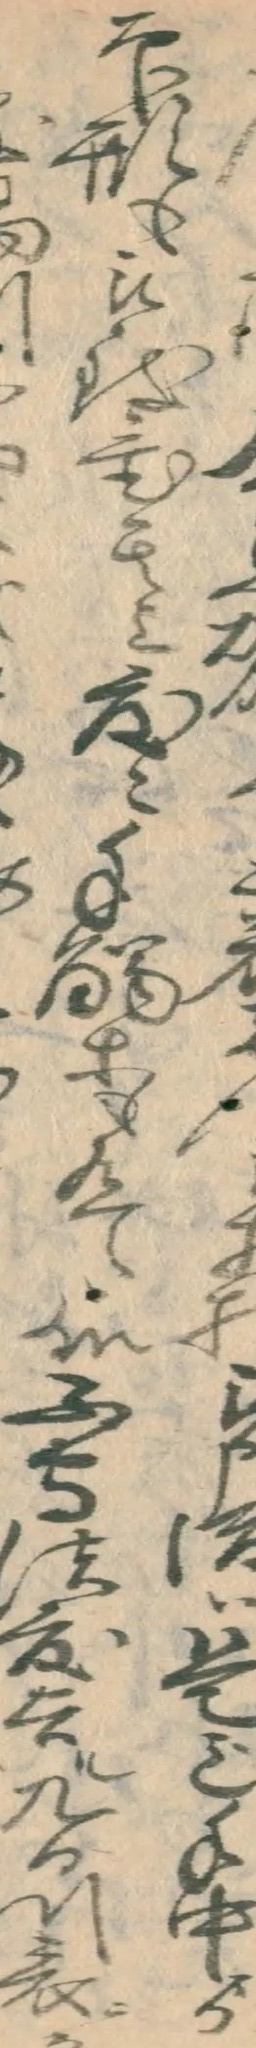印形も被致置其上度々手触等も有之候処不守法度去ル九日川表ニ而
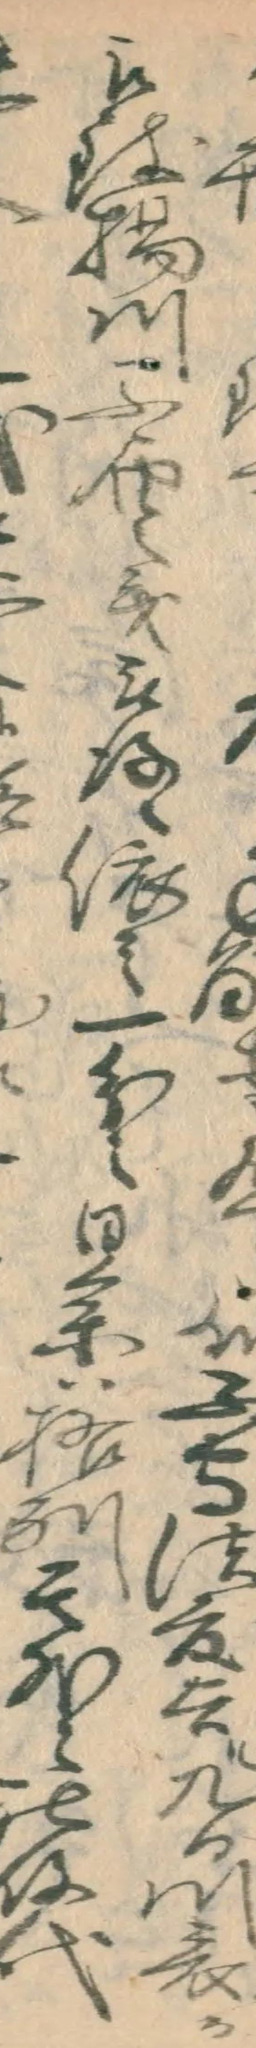被致揚川不届之義被存候依之一分之日参ハ格別其外之社役代
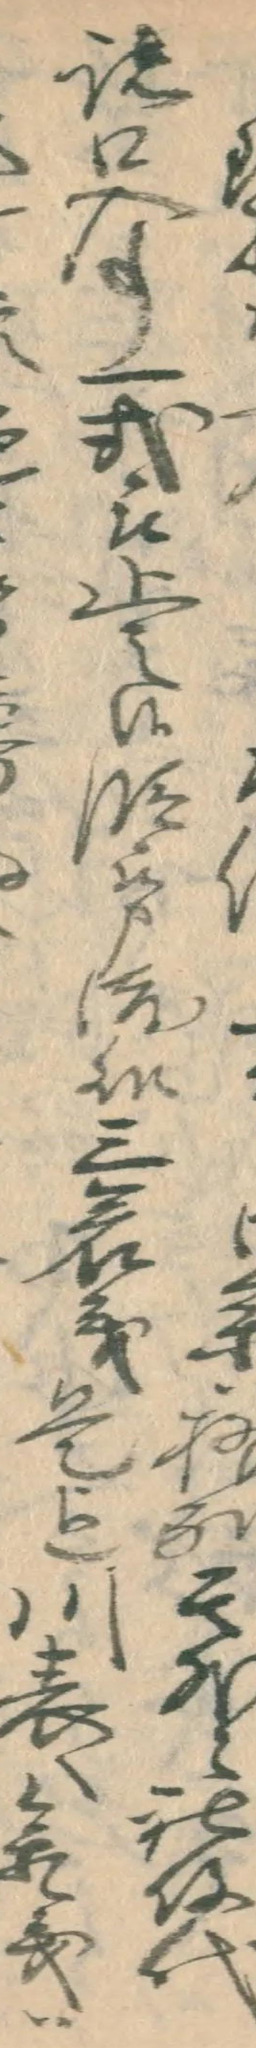諸口入事一式被止之候段被申渡処三若義是迄川表へ参候義ハ
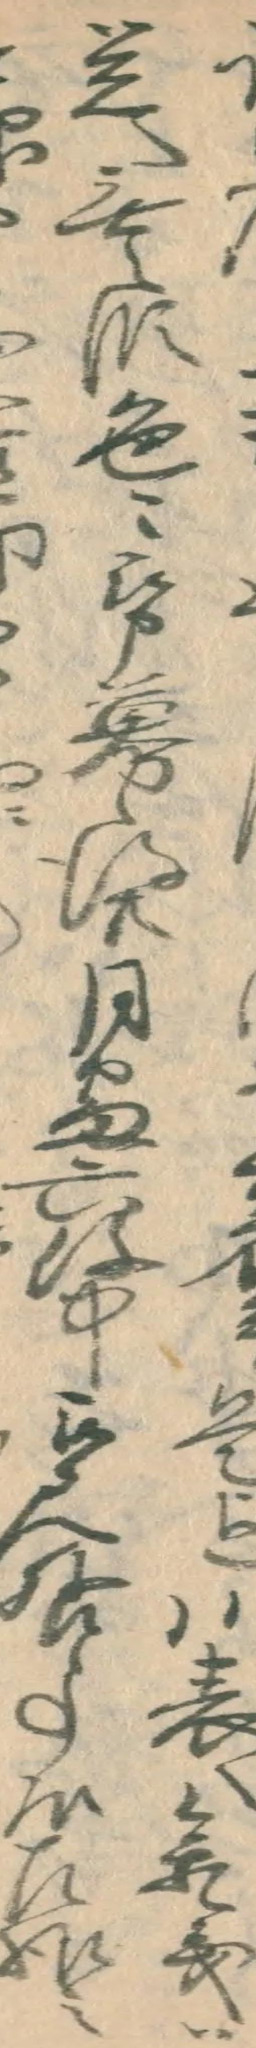覚へ無之段色々被申募候得共月番六役中被見咎候事故左様之
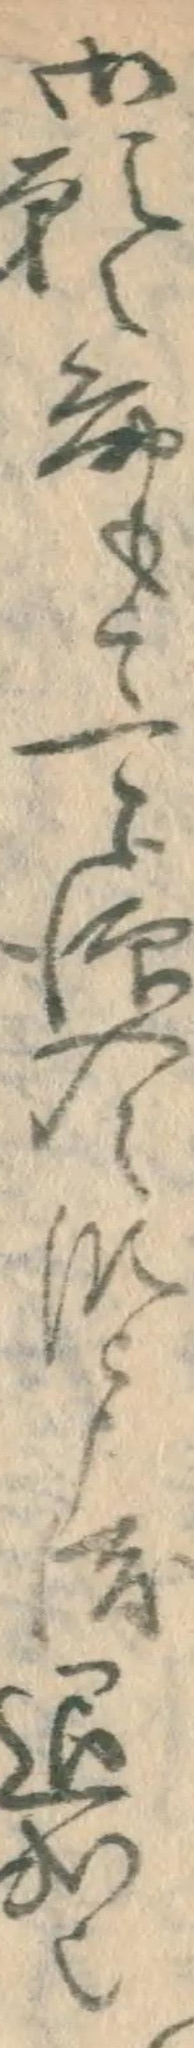御願之筋も候ハヽ可被仰入之段被申渡退出也
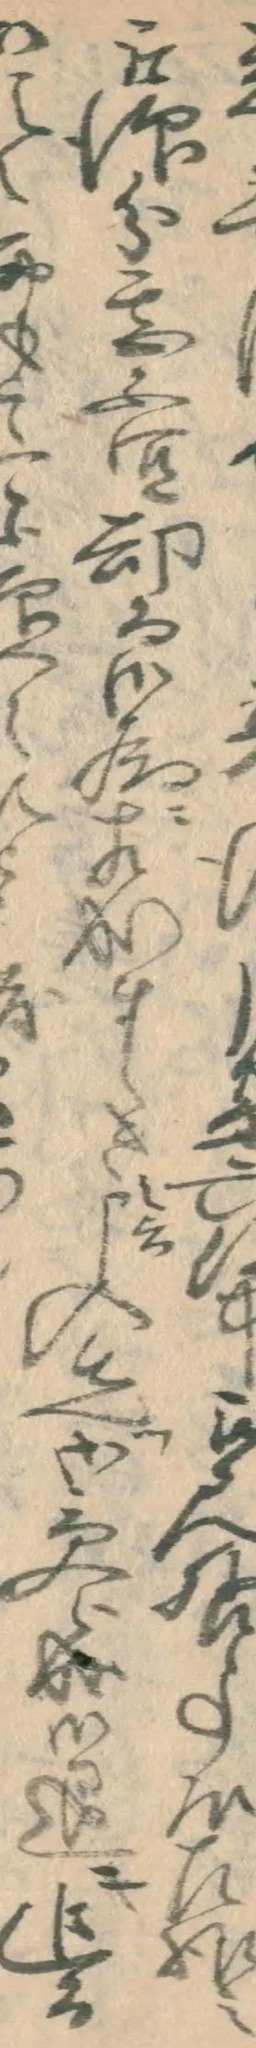被仰分甚不宜却而御為ニ相成ましき之旨申入先ツ御受被成御退キ追而
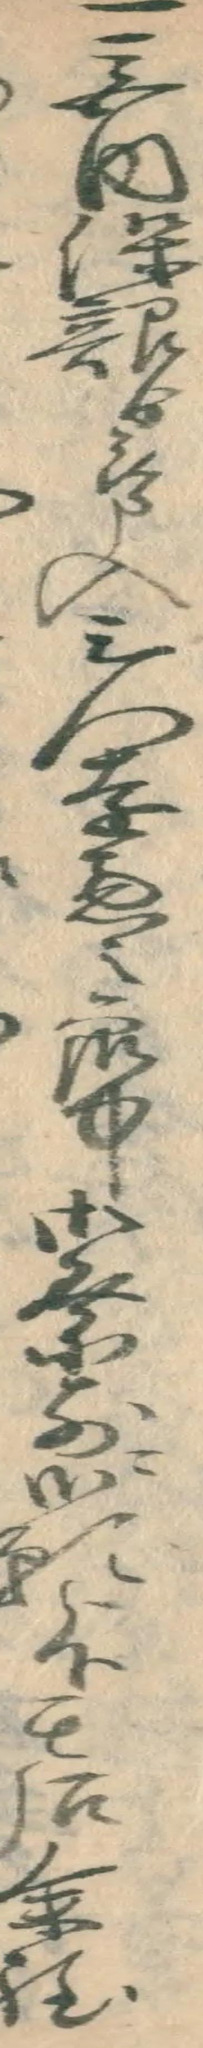一宮内保韶ゟ被申入三人遠慮之衆中御祭前ニ御願被下其后余程
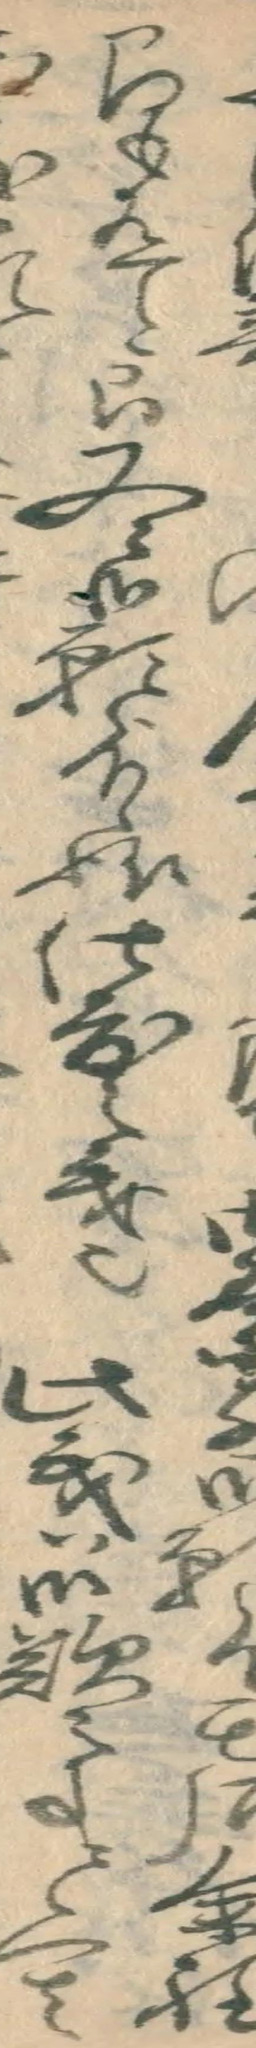間も有之候間又々御願被下候様仕度之義也此義ハ御歎之事ニ候へ者
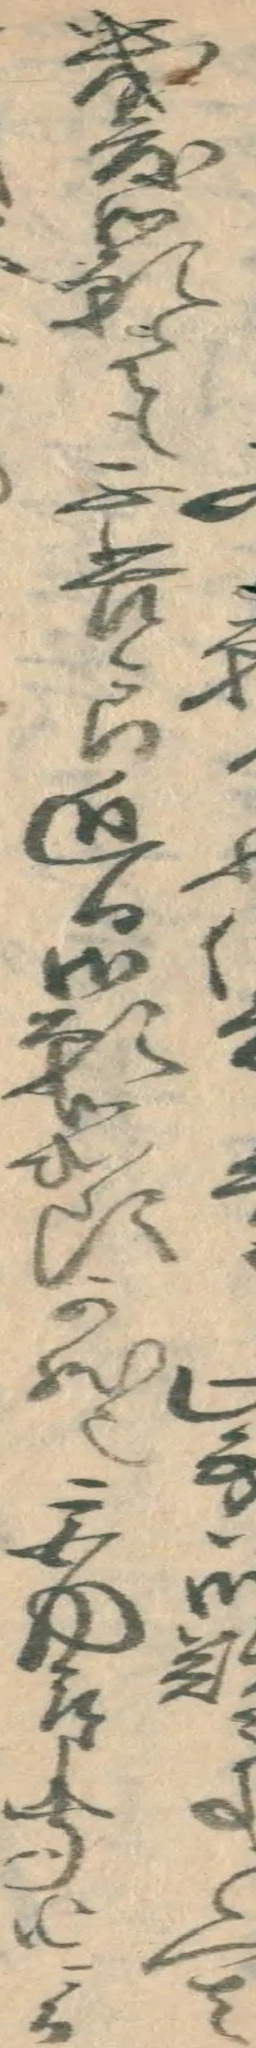幾度御願候ても不苦候間近日御願御出頭可然也宮内被申聞由ニ而
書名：賀茂社記録. 第58冊
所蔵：国立国会図書館 National Diet Library, JAPAN
